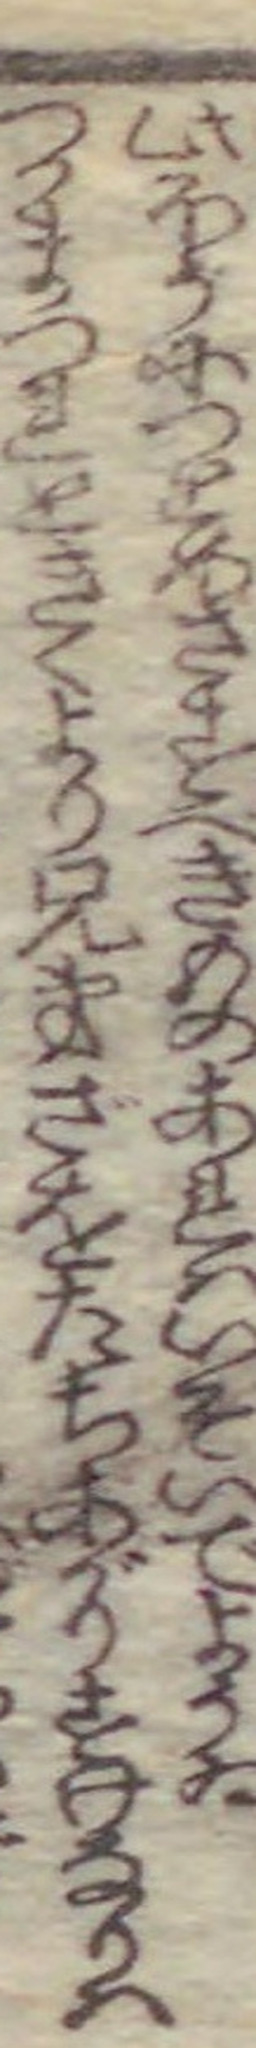つかまつれときくより兄弟ざをたちあがりすけなりは
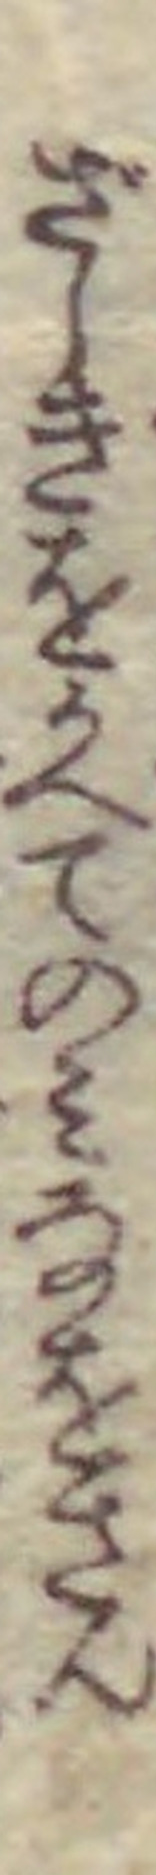ざしきをかへてのみなをさん
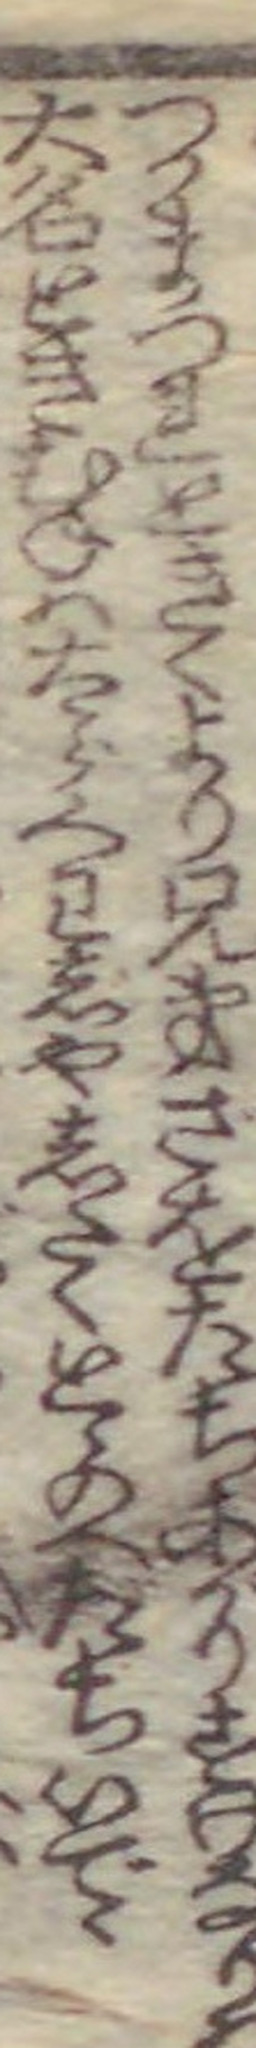大名ときむねは太郎くわしやしたくとゝのへたちいでゝ
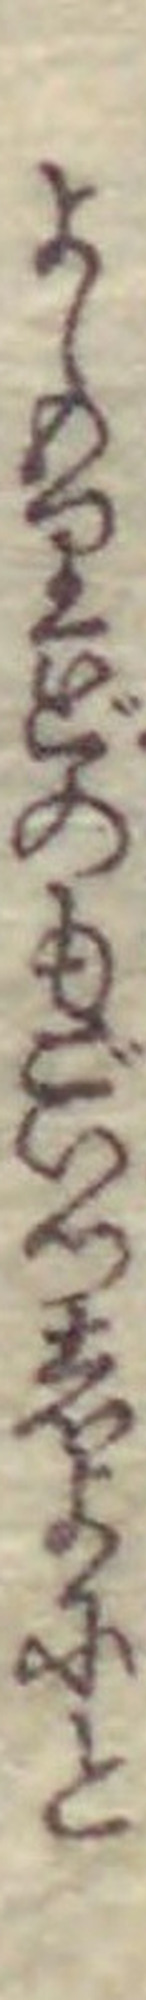よしもりどのもごいつしよにと
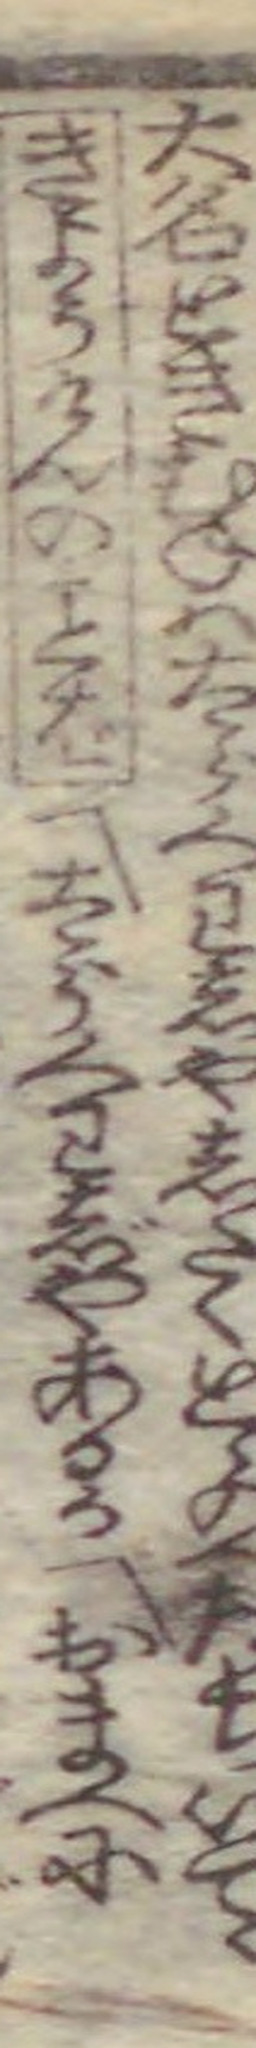きようけんのことば〽太郎くわじやあるか〽おまへに
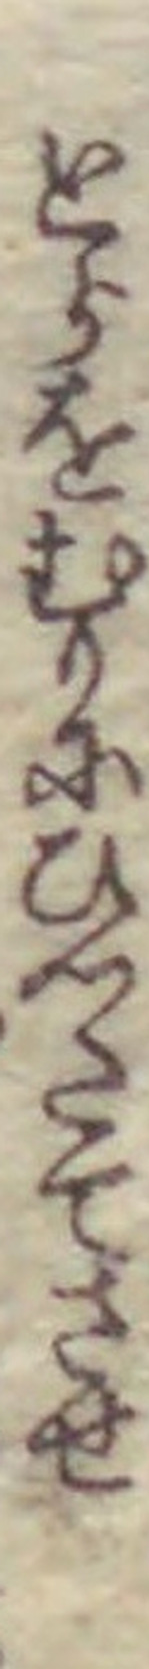とらをむりにひつたてさせ
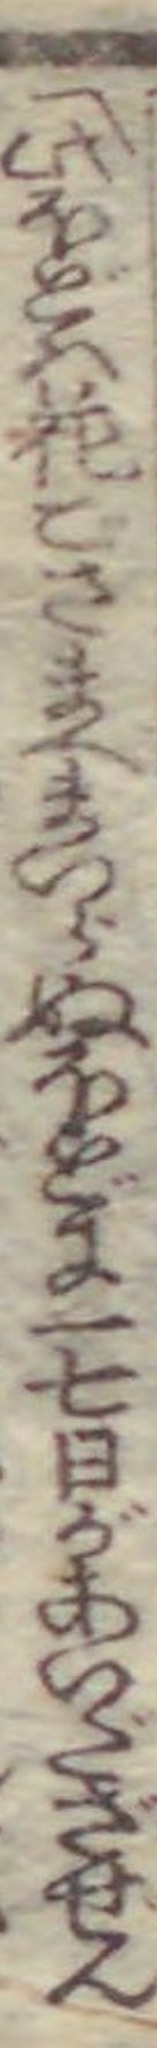〽此ほどは花ごさまへまいらぬほどに一七日があいだざぜん
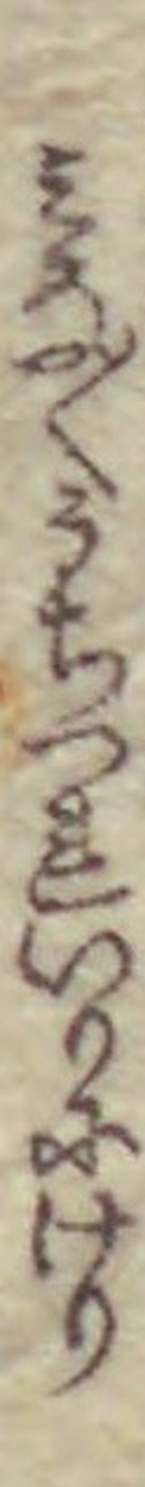みな〳〵うちつれいりにけり
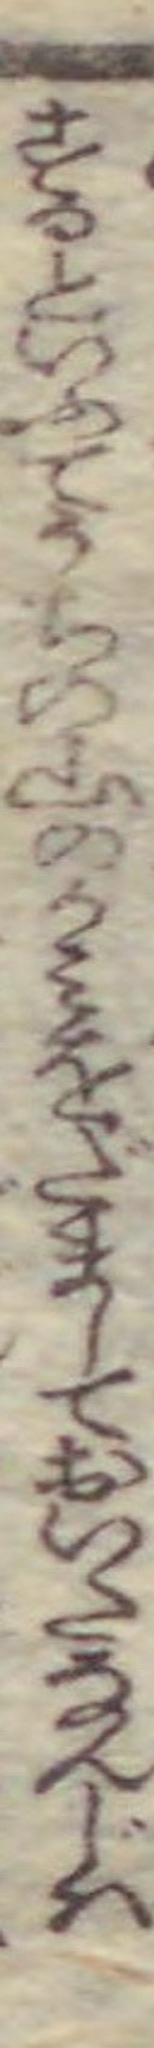するといふてうちの山のかみをだましておいたなんじは
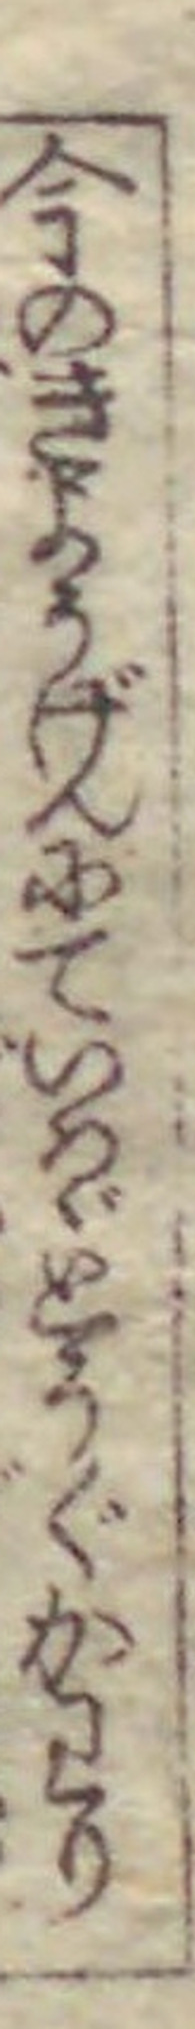今のきようげんにていはゞとう〴〵かわり
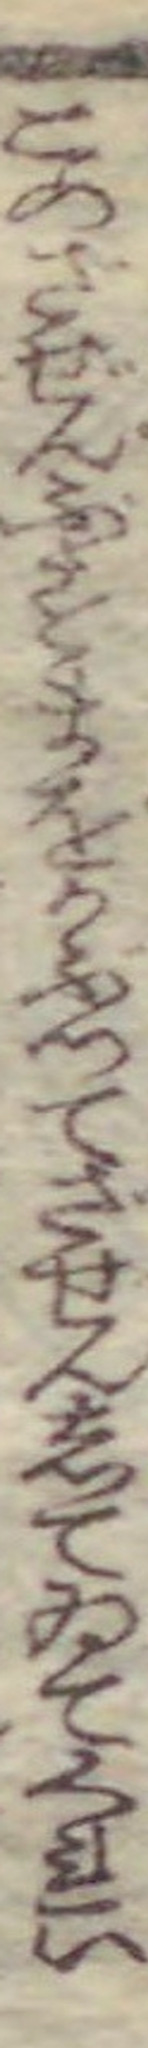このざぜんふすまをかぶつてざせんしてゐてくれい
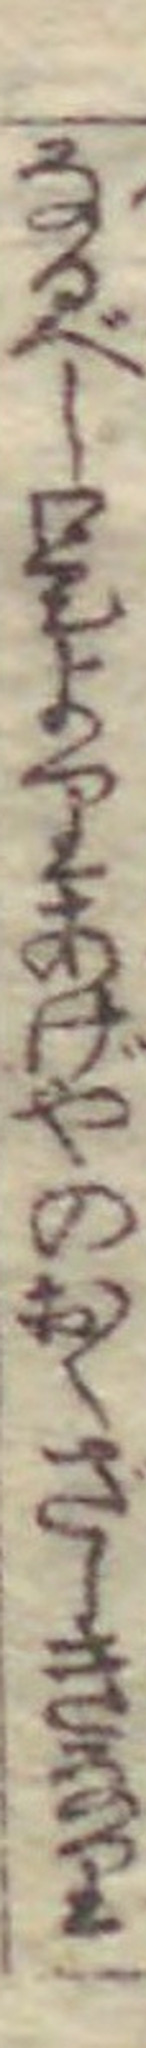なるべし是よりあげやのおくざしきなり
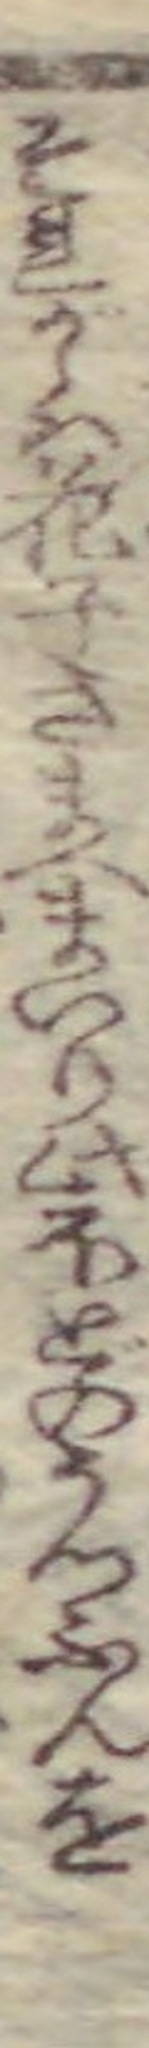それがしは花子さまへまいり此ほどのうつふんを
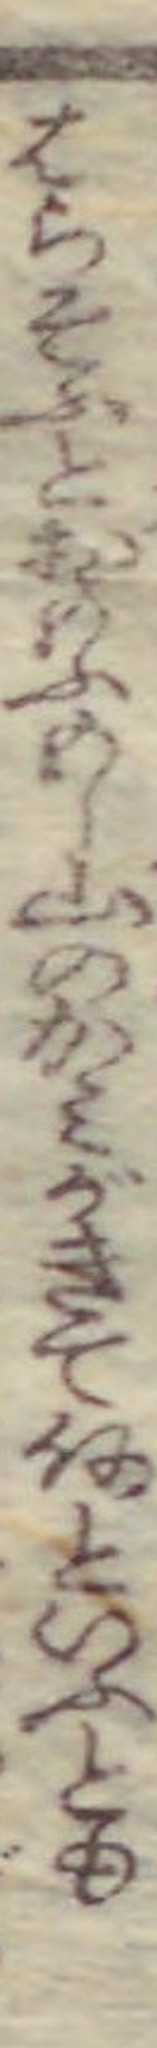はらそふとおもふもし山のかみがきて何といふとも
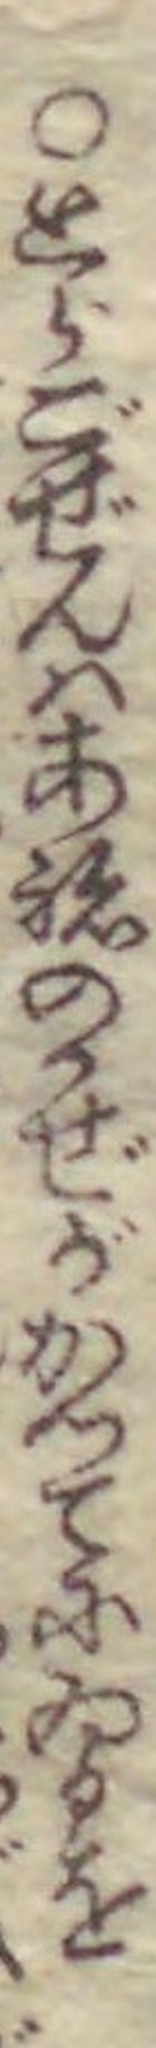○とらごぜんはあねのかぜがかうてにゐるを
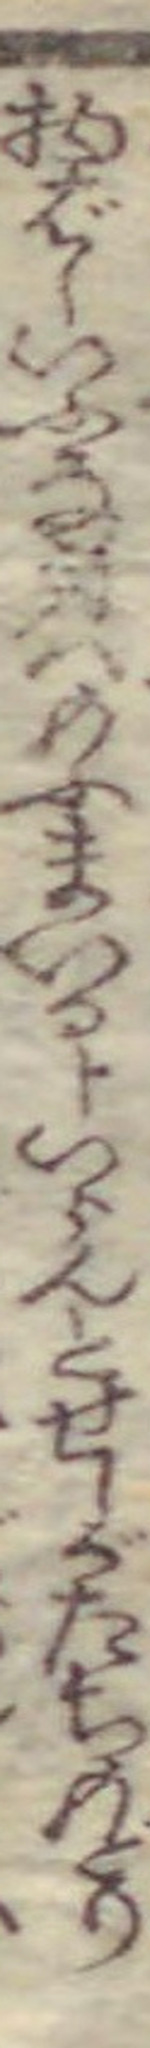物ばしいふな身はもふまいるといらんとせしがたちもどり
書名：大時代唐土化物 3巻. 曽我太夫染
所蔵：国立国会図書館 National Diet Library, JAPAN
